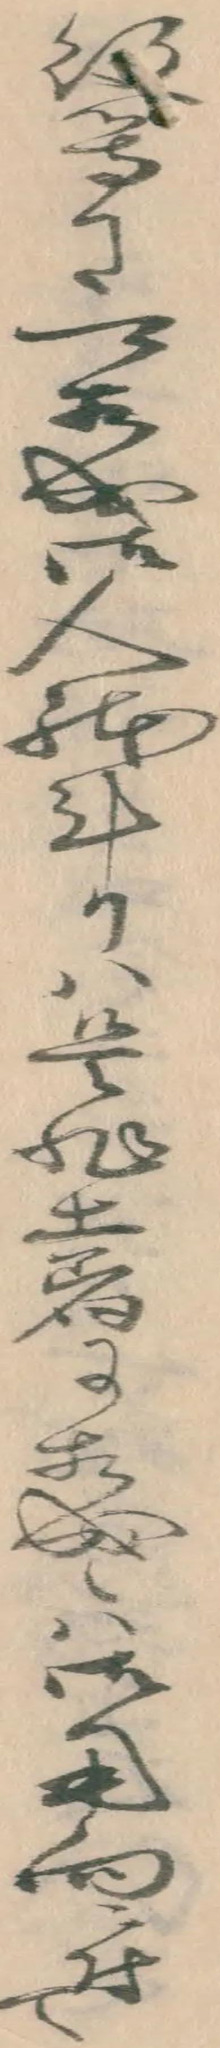役等に可相成御人体計りは是非土着に相成候は御用向に付て
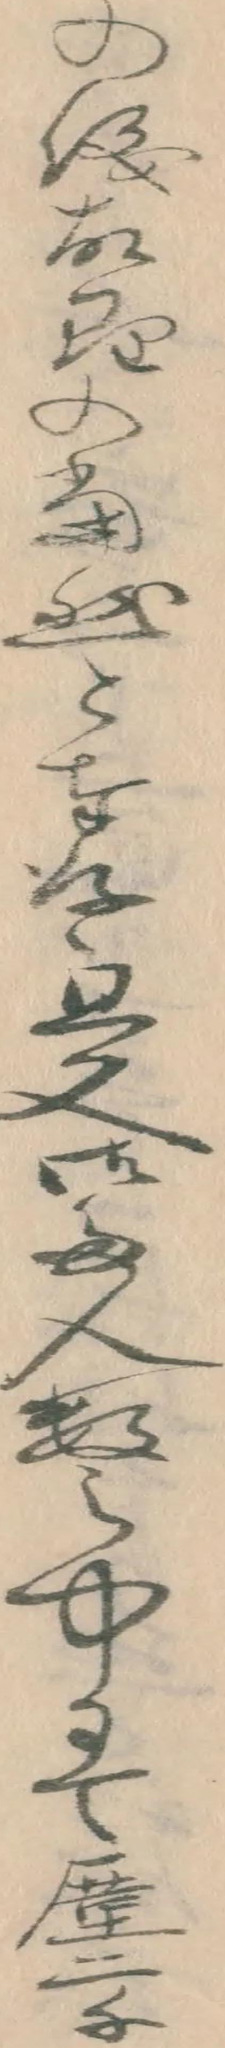の儀故理の当然と奉存候且又御多人数之中にて厪二千
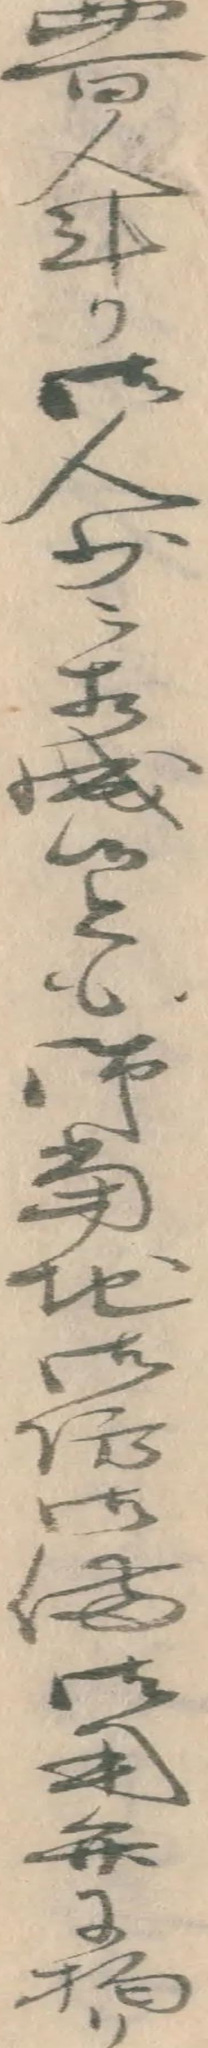四百人計り御人少々相なり候とも御当地御防御備御用弁に拘り
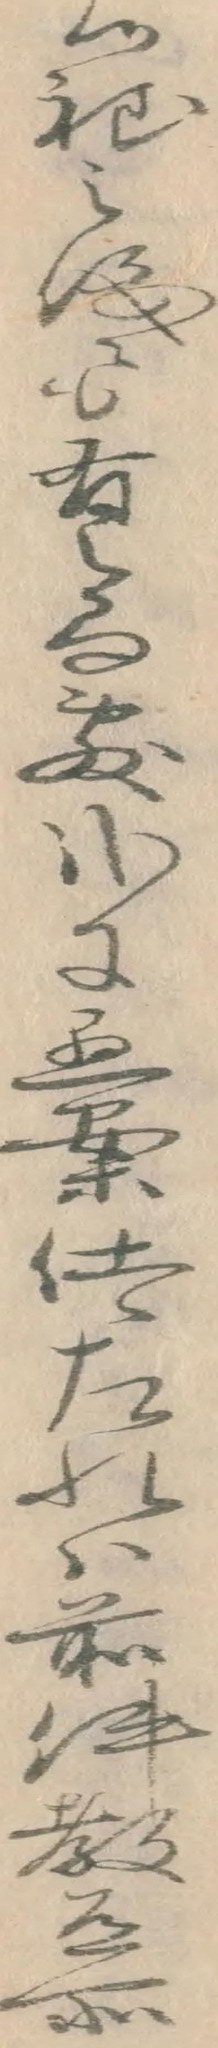候程之儀にも有之間敷哉に愚案仕候されは前件教道所
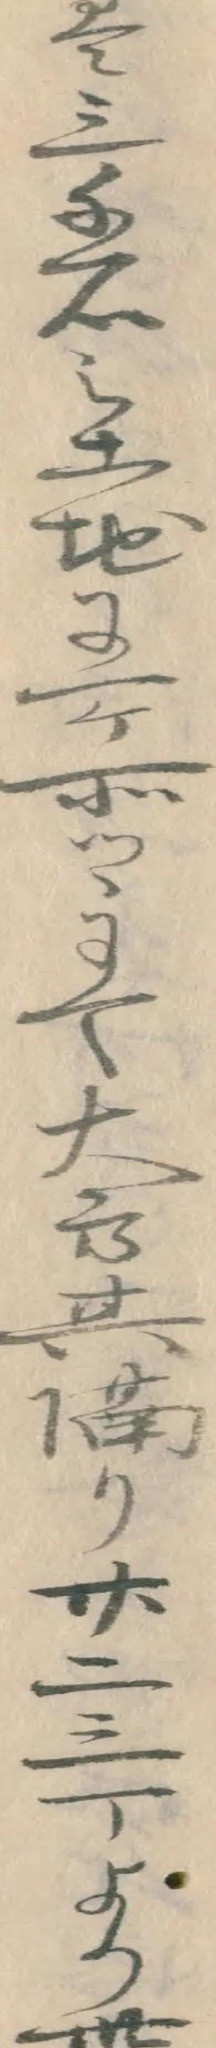は三千石之土地に一ケ所つゝにて大方其隔り廿二三丁より卅
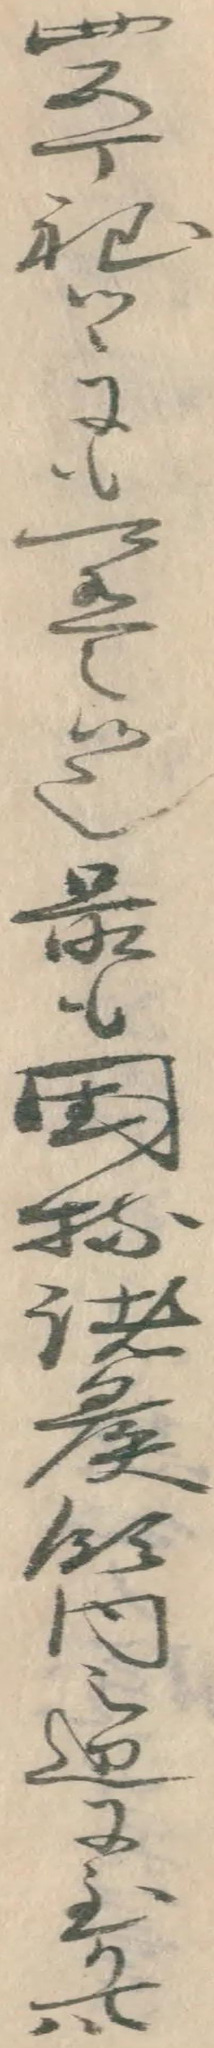四五丁程つゝにも可有之候也最も国持諸侯領内之辺に至りては
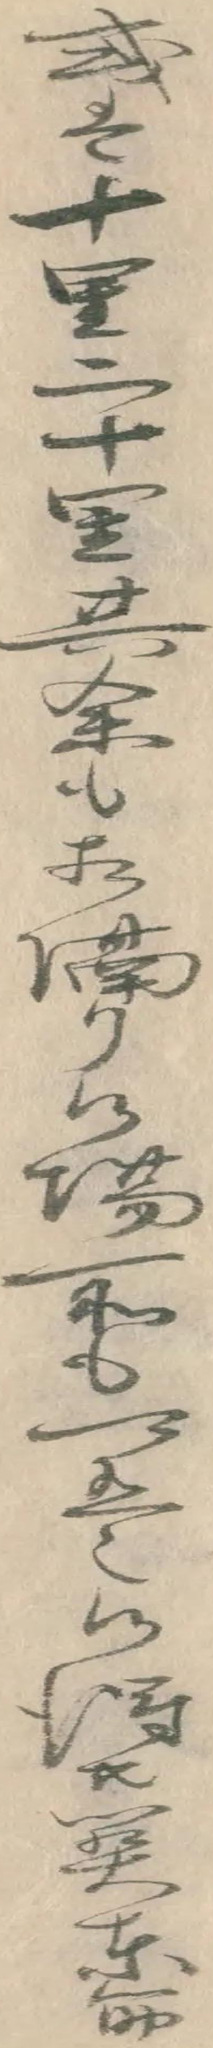或は十里二十里其余も相隔り候場所も可有之候得共関東筋
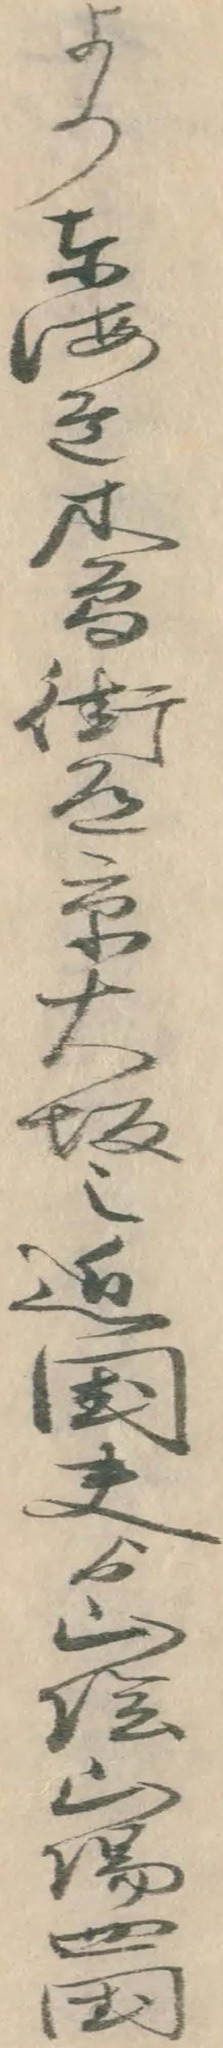より東海道木曽街道京大坂之近国夫ゟ山陰山陽四国
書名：斎庭之穂
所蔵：国立国会図書館 National Diet Library, JAPAN
